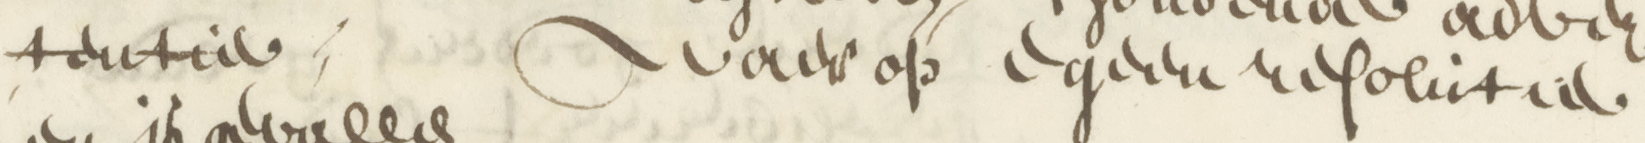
„tentie: Waer op egeen resolutie
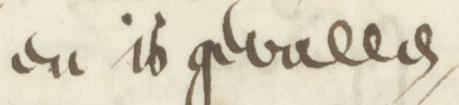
en is gevallen.
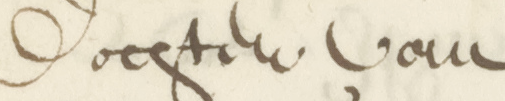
Dochter van
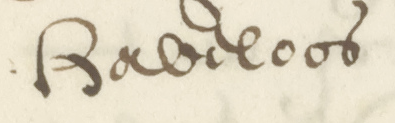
Haveloos
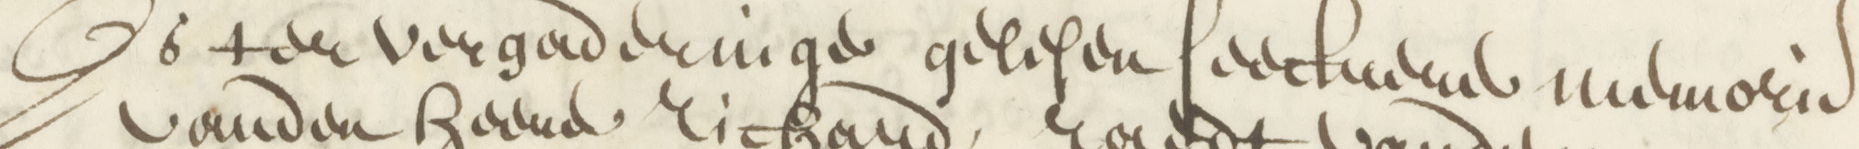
Is ter Vergaderinge gelesen seeckere memorie
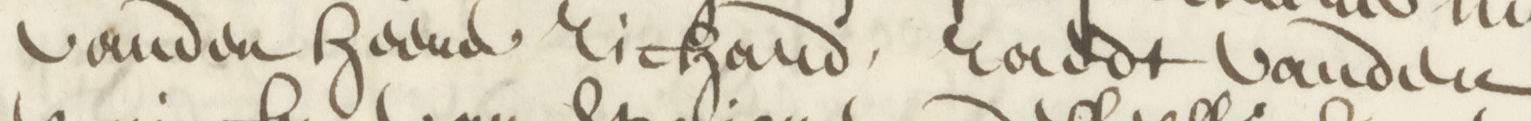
vanden heere Richard, raedt vanden
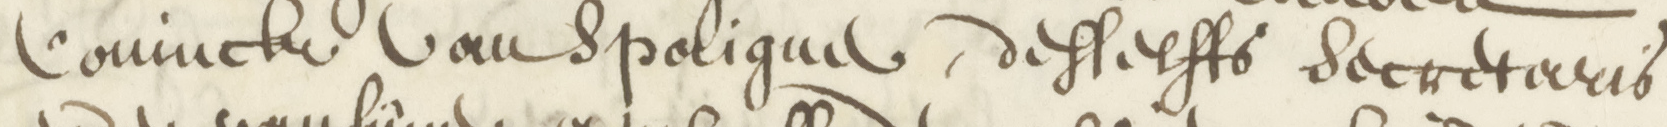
Coninck van Spaigne, desselffs Secretaris
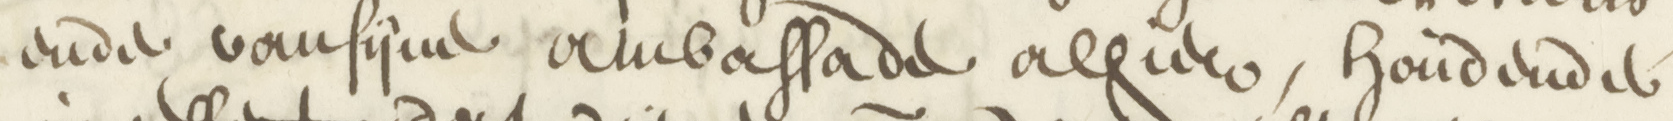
ende van sijne Ambassade alhier, houdende
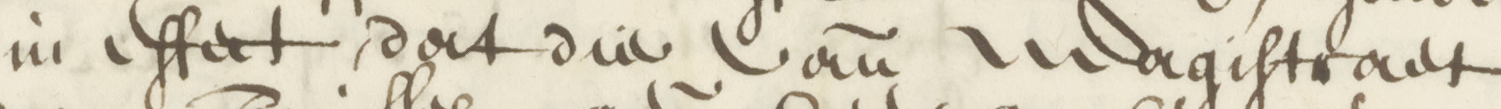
in effect, dat die van Magistraet
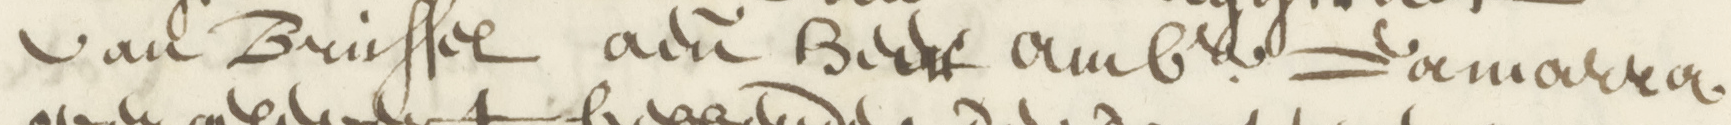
van Brussel aen heer Ambr. Gamarra
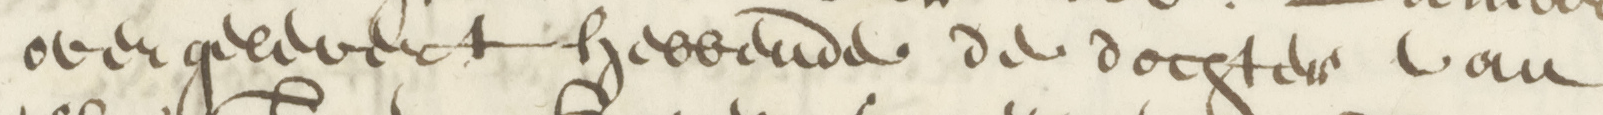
overgelevert hebbende de dochter van
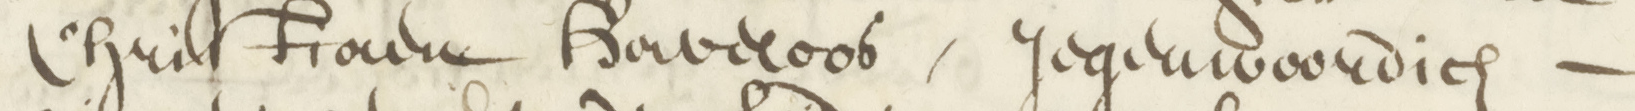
Christiaen Haveloos, Jegenwoordich -
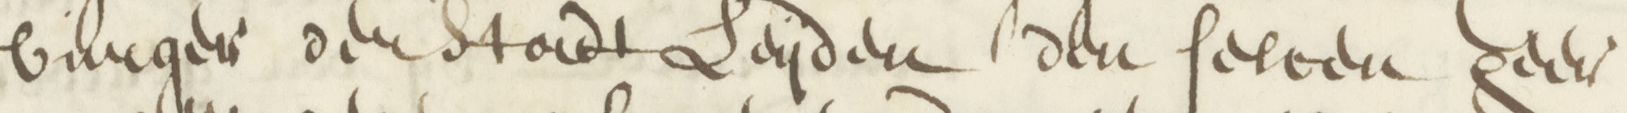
burger der stadt Leijden den selven heer
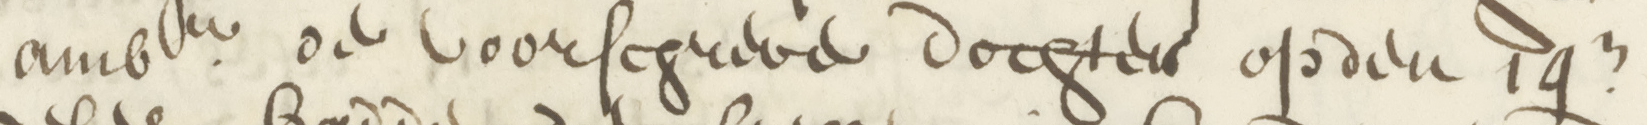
ambr. de voorschreve dochter opden 14n.
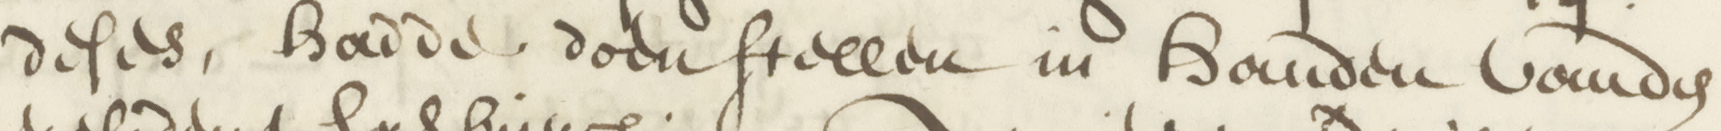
deses, hadde doen stellen in handen vanden
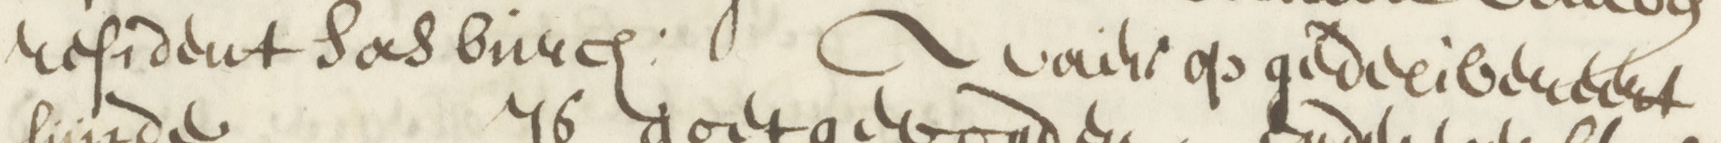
resident Sasburch: Waer op gedelibereert
